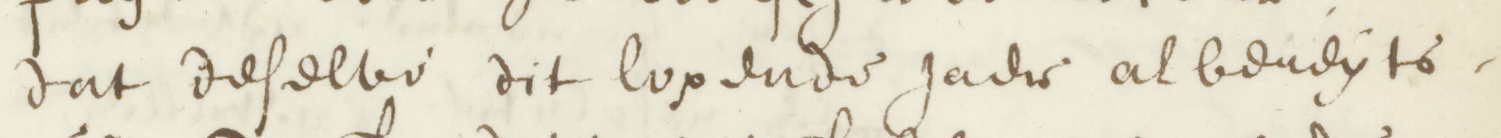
dat deselve dit lopende jaer albereijts
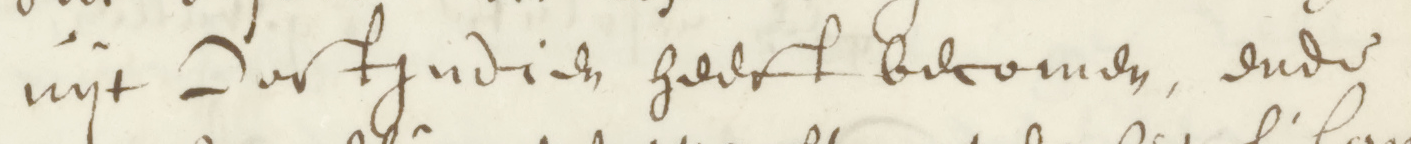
uijt Oostindien heeft becomen, ende
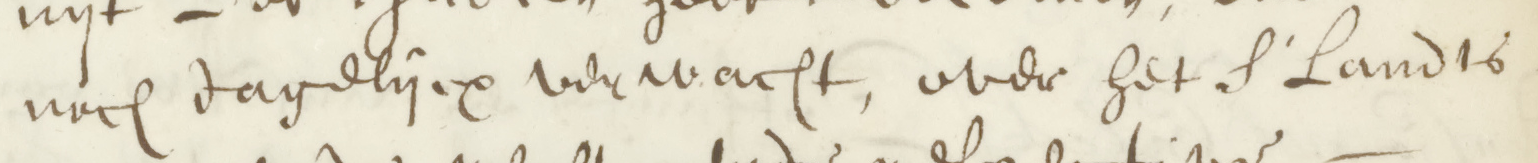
noch dagelijcx verwacht, over het s'Landts
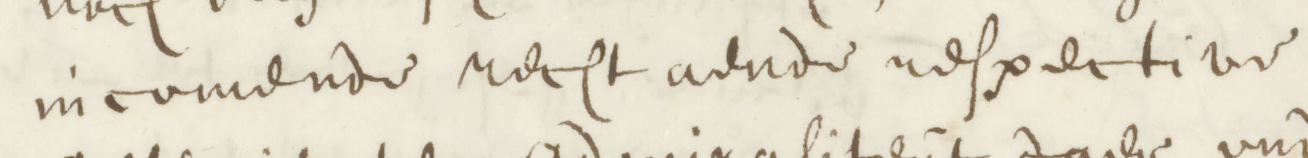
in comende recht aende respective
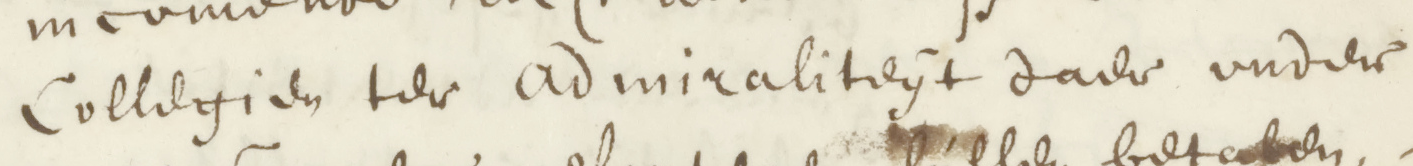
Collegien ter Admiraliteijt daer onder
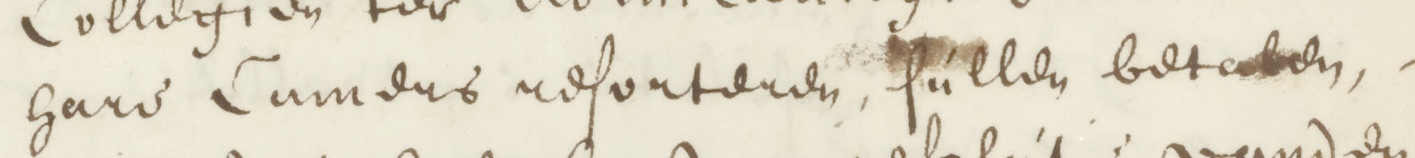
hare Camers resorteren, sullen betalen,
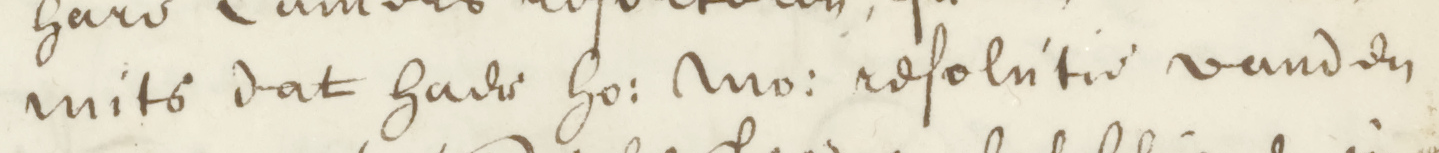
mits dat haer ho:mo: resolutie vanden
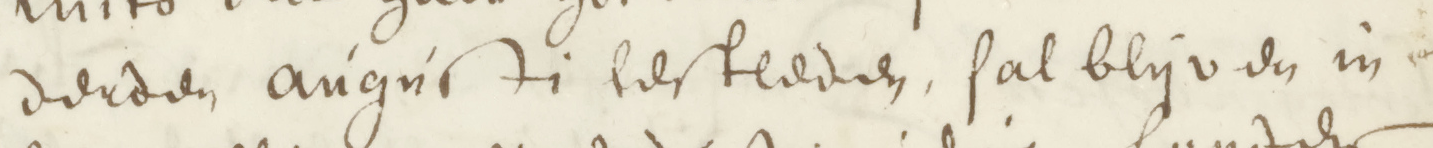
derden augusti lestleden, sal blijven in
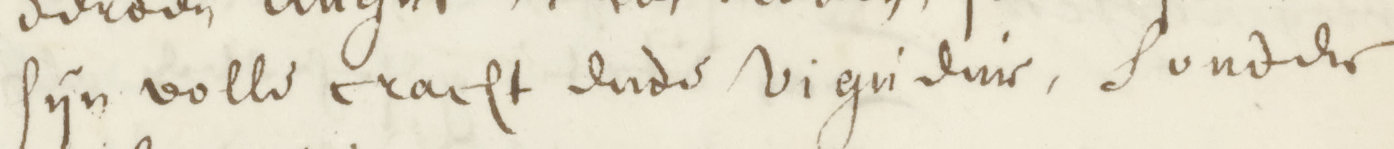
sijn volle cracht ende vigueur, sonder
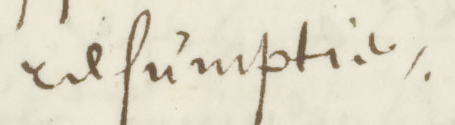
resumptie.
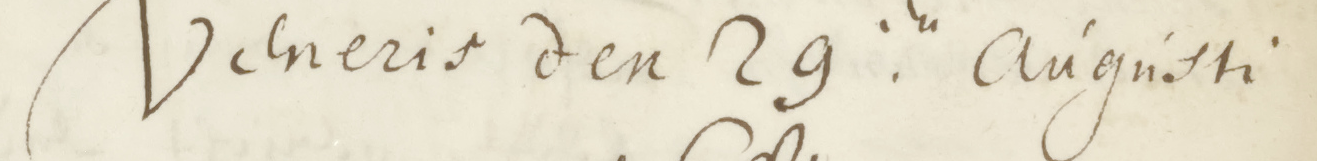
Veneris den 29en. augusti
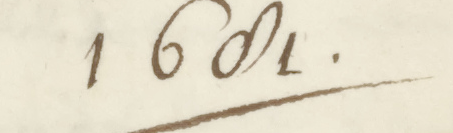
1681.
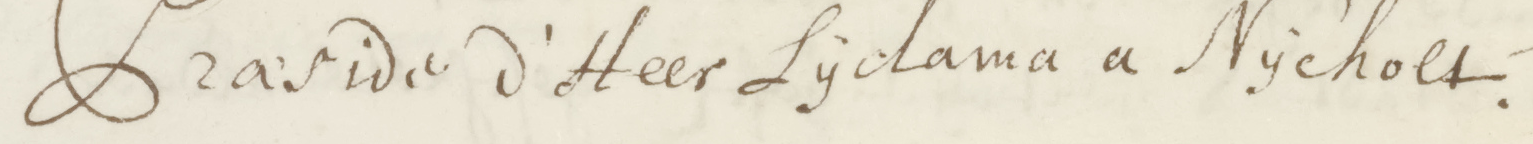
Præside d'Heer Lijclama a Nijeholt.
